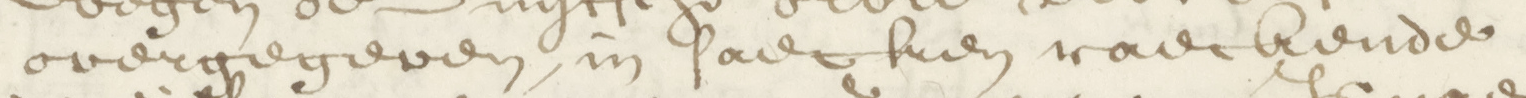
overgegeven, in saecken raeckende
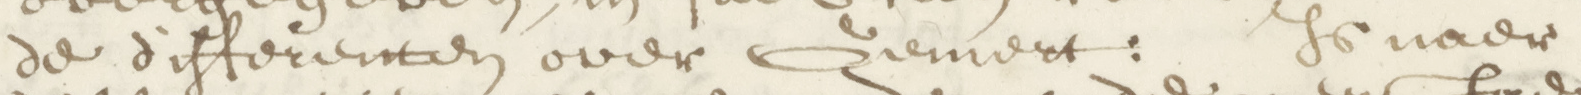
de differenten over Gemert: Is naer
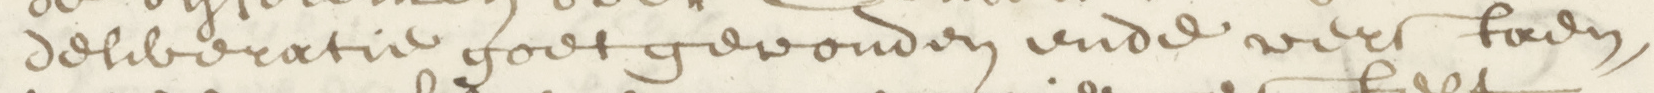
deliberatie goet gevonden ende verstaen,
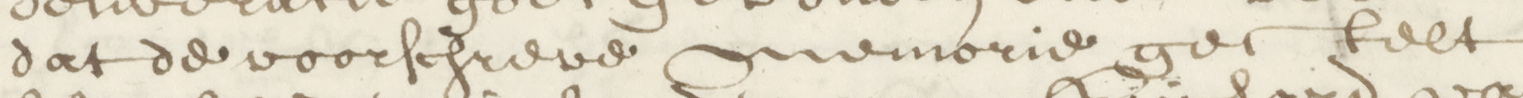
dat de voorschreve memorie gestelt
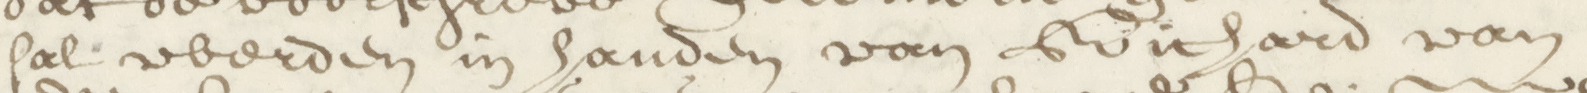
sal worden in handen van Richard van
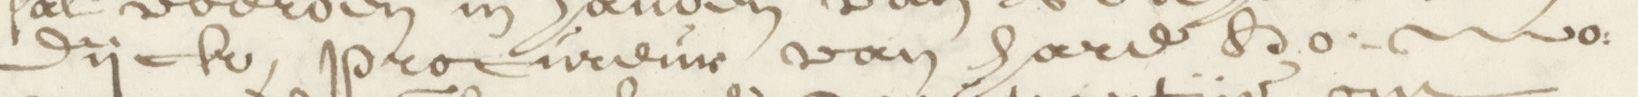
Dijck, procureur van hare Ho:Mo:
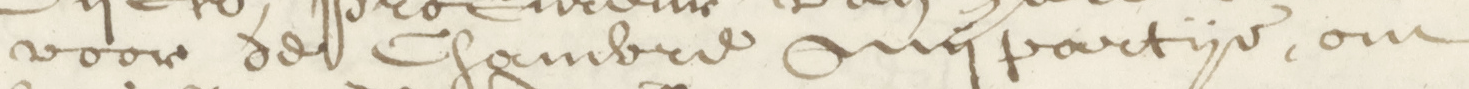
voor de Chambre Mijpartije, om
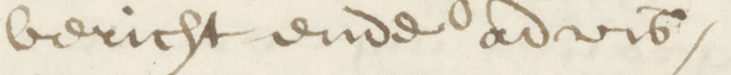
bericht ende advis.
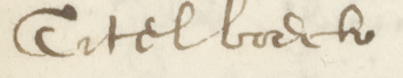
Titelboeck
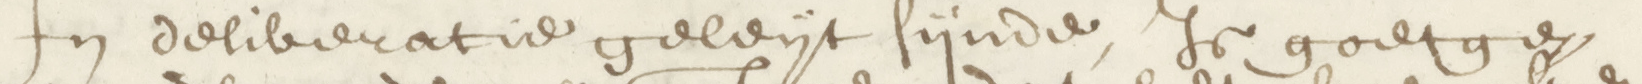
In deliberatie geleijt sijnde, Is goetge„
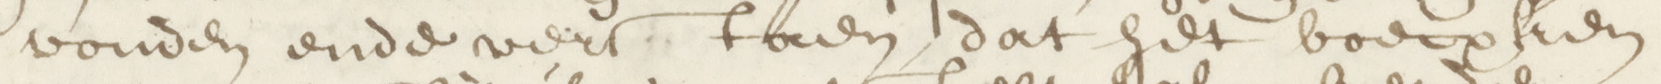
vonden ende verstaen dat het boecxken
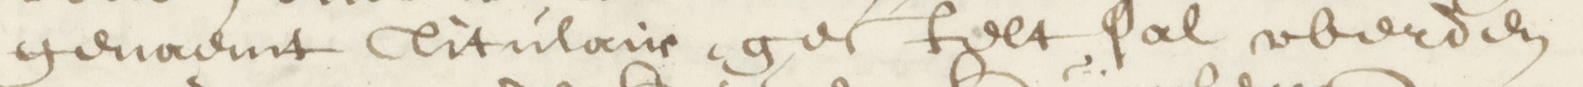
genaemt Titulair, gestelt sal werden
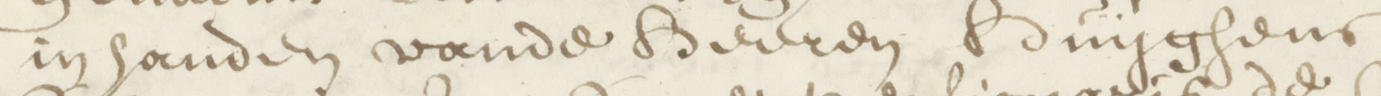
in handen vande heeren Huijghens
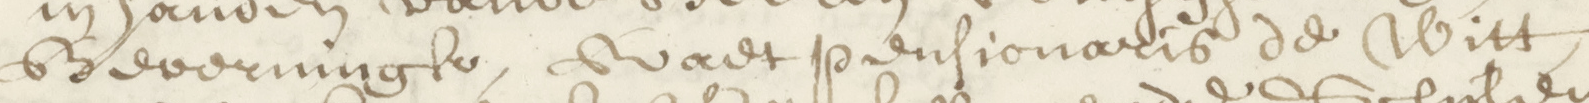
Beverningk, Raet pensionaris de Witt
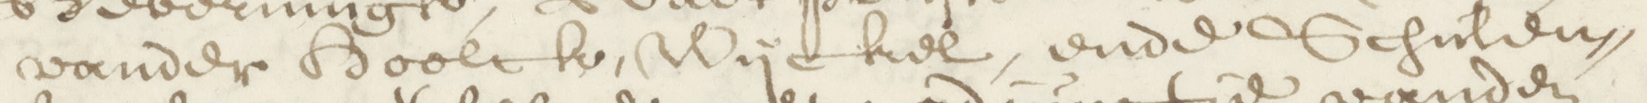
vander Hoolck, Wijckel ende Schulen„
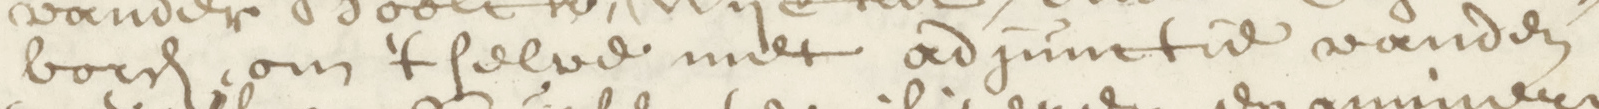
borch, om 't selve met adjunctie vanden
